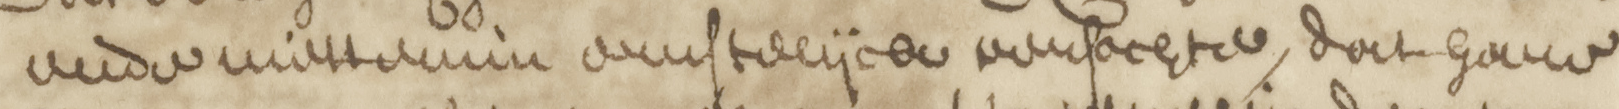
ende niettemin ernstelijck versochte, dat hare
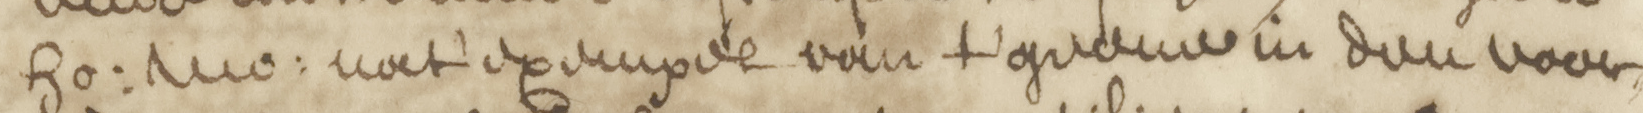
Ho:Mo: nat exempel van t'geene in den voor
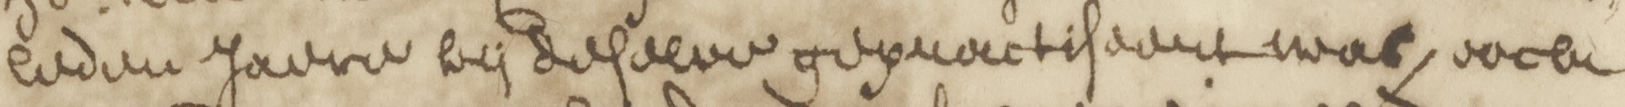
leden Jaere bij deselve gepractiseert was, oock
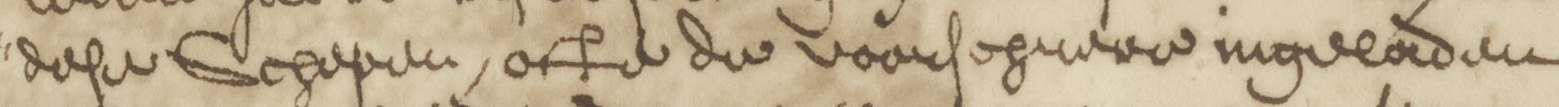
dese Schepen, ofte de voorschreve ingeladen
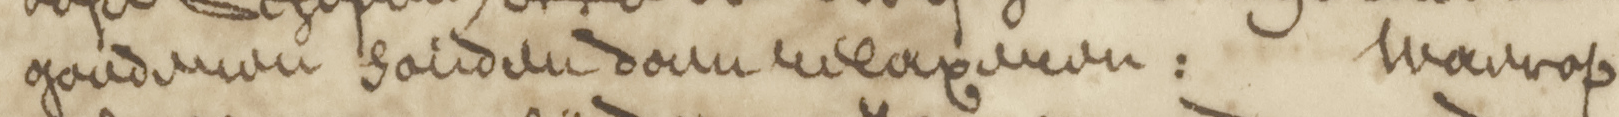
goederen souden doen relaxeren: Waerop
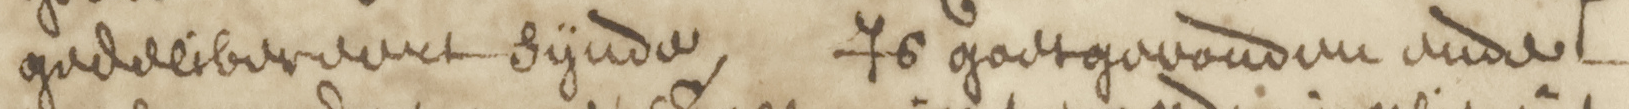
gedelibereert sijnde, Is goetgevonden ende
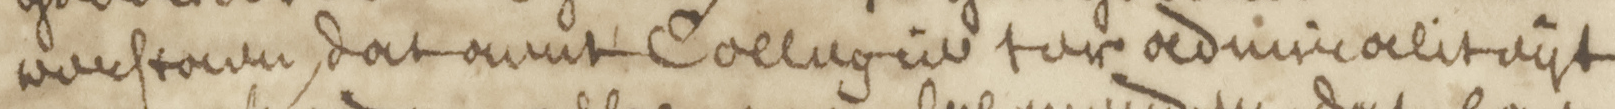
verstaen, dat aent Collegie ter admiraliteijt
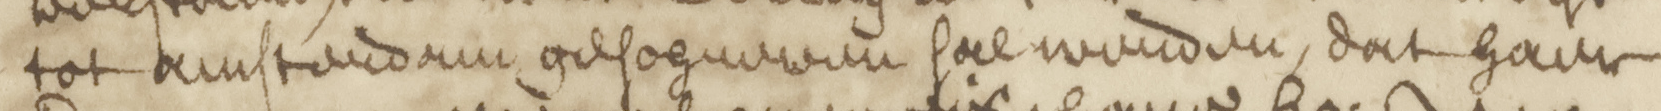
tot Amsterdam geschreven sal werden, dat haer
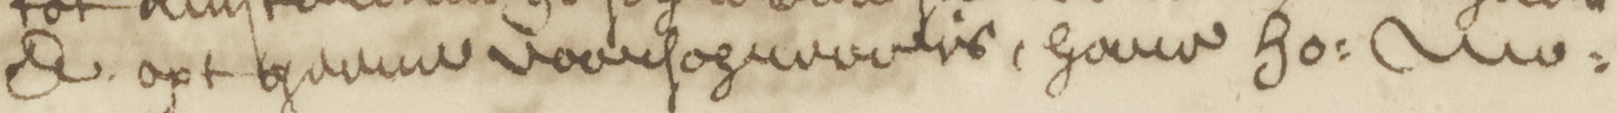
E. opt geene voorschreve is, hare Ho:Mo:
